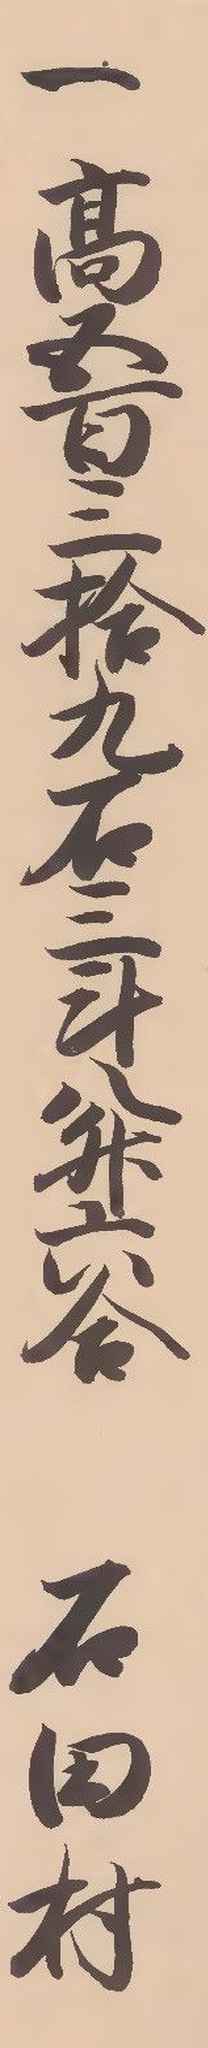一高五百三拾九石三斗八升六合石田村
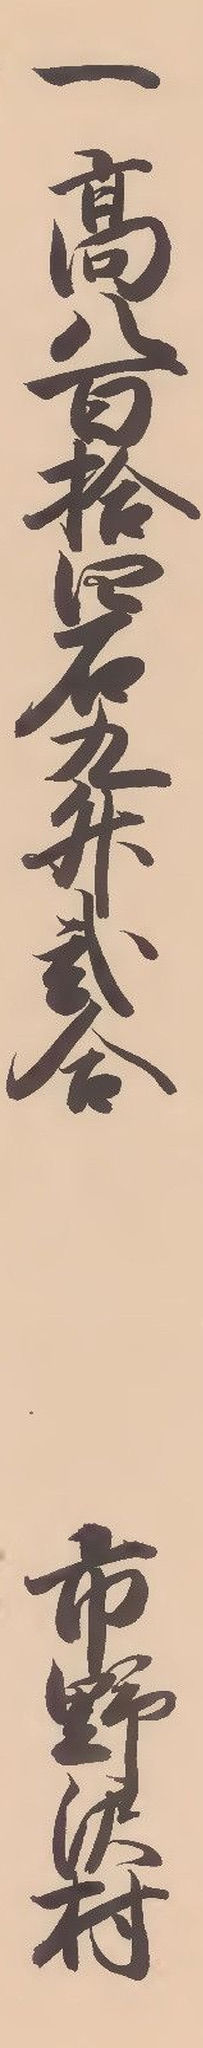一高八百拾四石九升弐合市野沢村
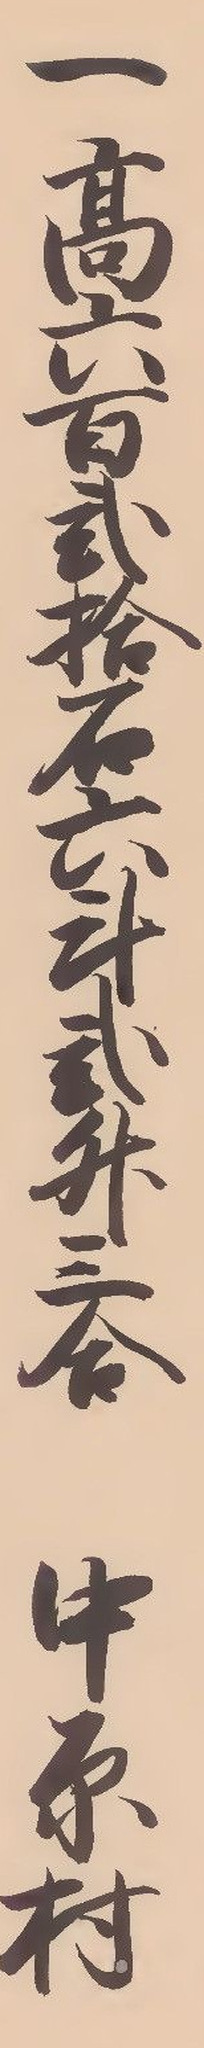一高六百弐拾石六斗弐升三合中原村
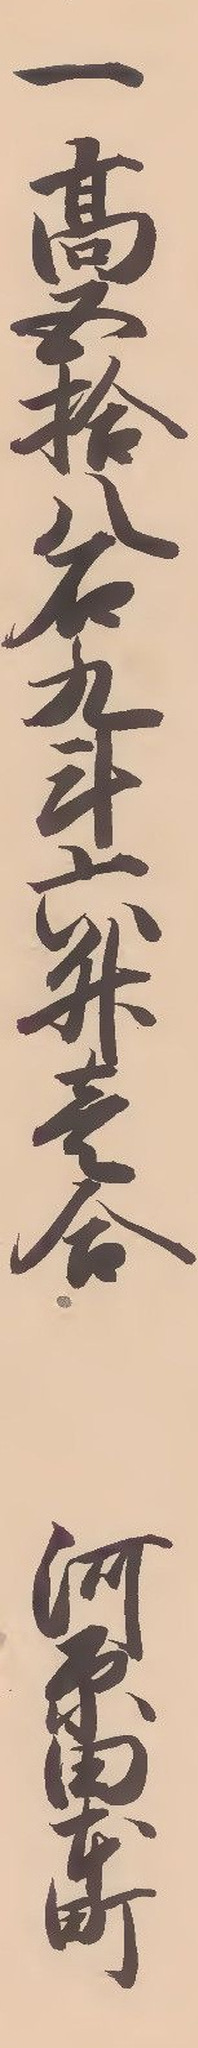一高五拾八石九斗六升壱合河原田本町

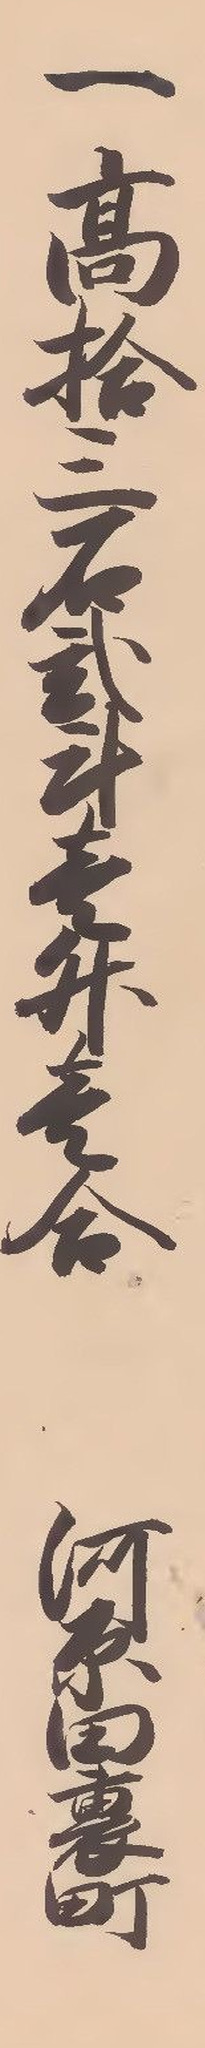一高拾三石弐斗壱升壱合河原田裏町
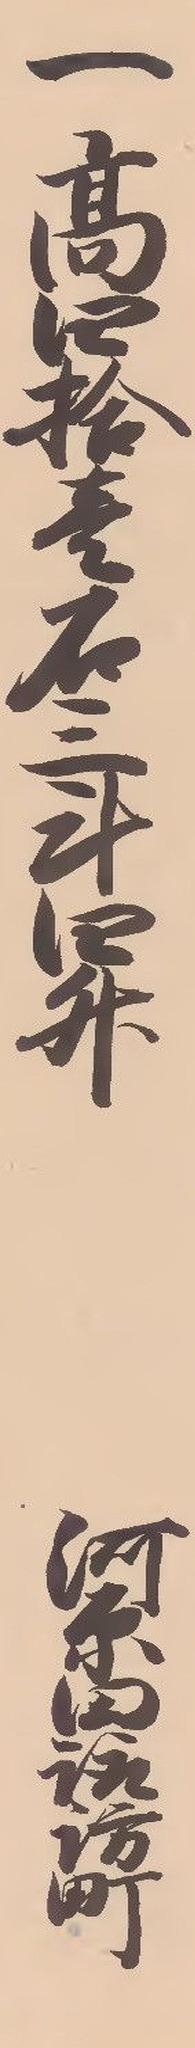一高四拾壱石三斗四升河原田諏訪町
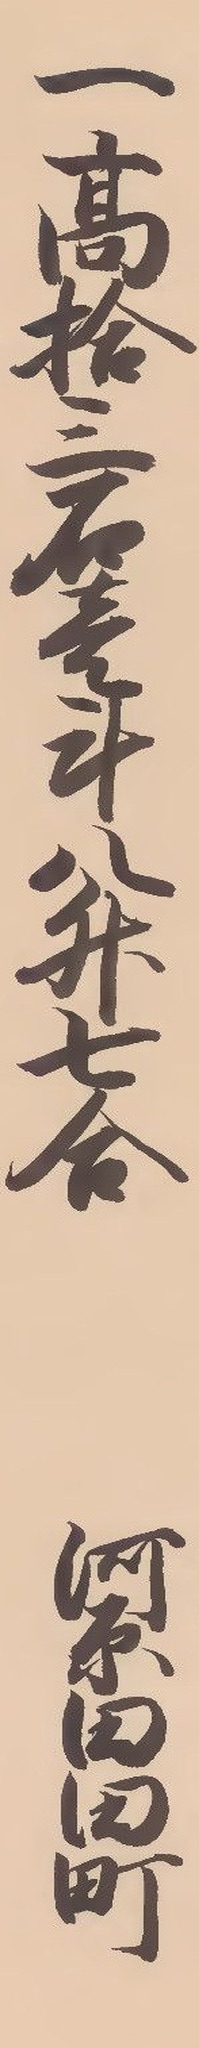一高拾三石壱斗八升七合河原田田町
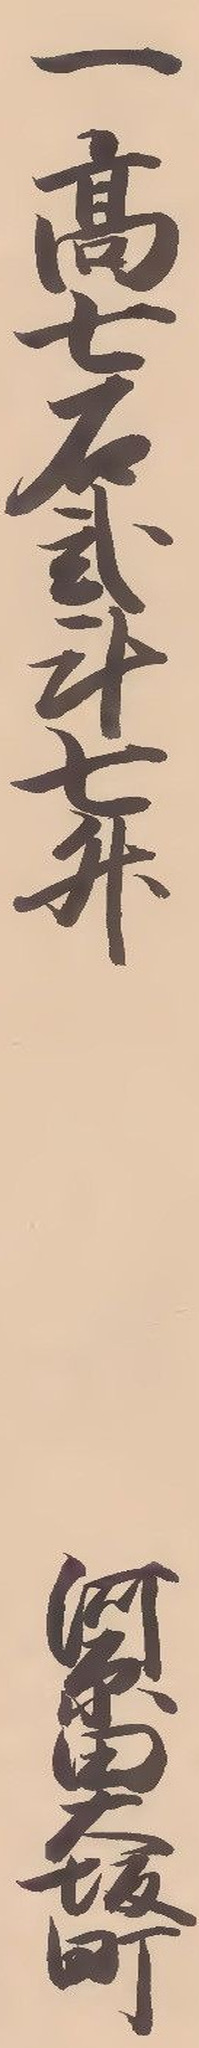一高七石弐斗七升河原田大坂町
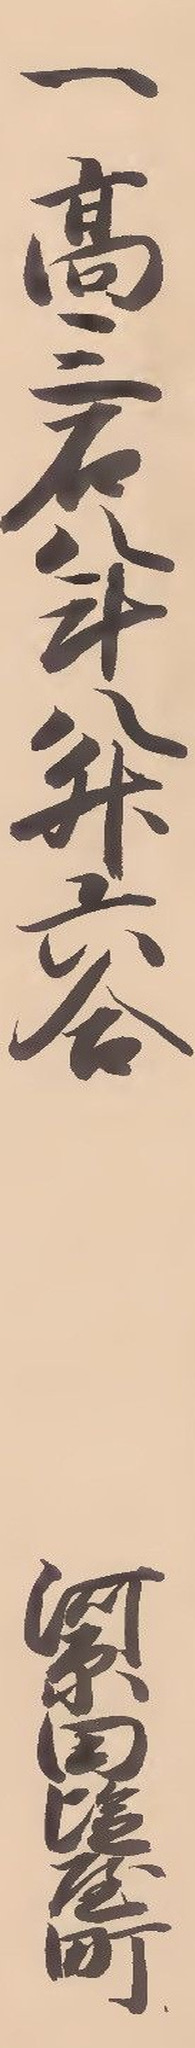一高三石八斗八升六合河原田塩屋町
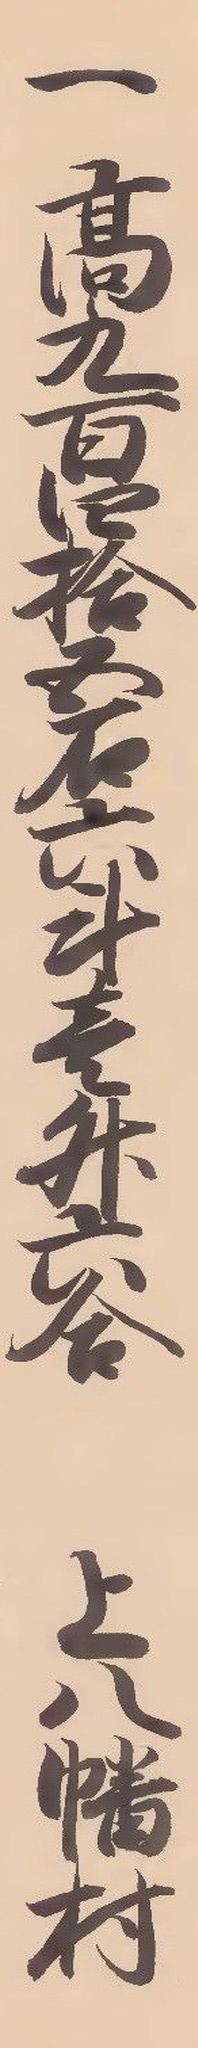一高九百四拾五石六斗壱升六合上八幡村
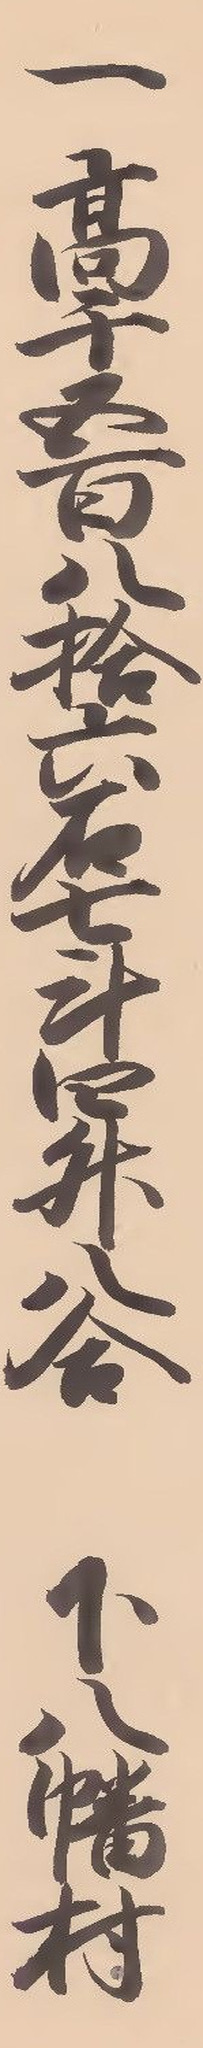一高千五百八拾六石七斗四升八合下八幡村
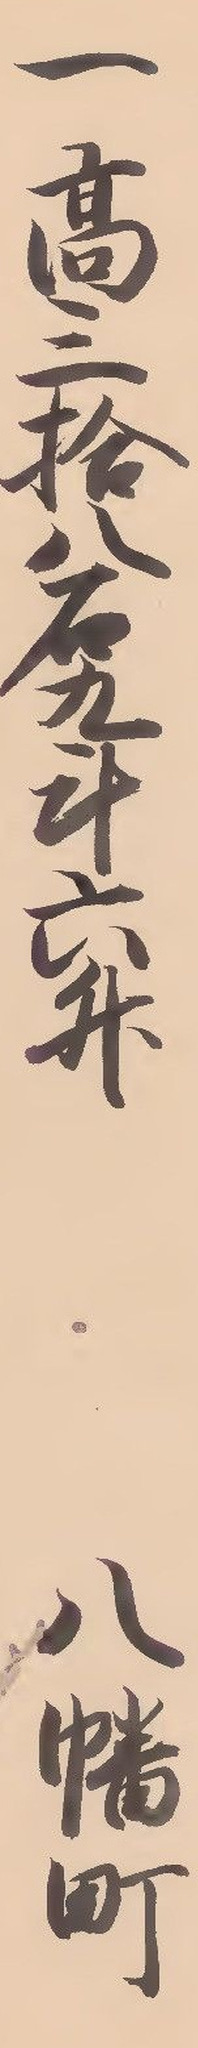一高三拾八石九斗六升八幡町

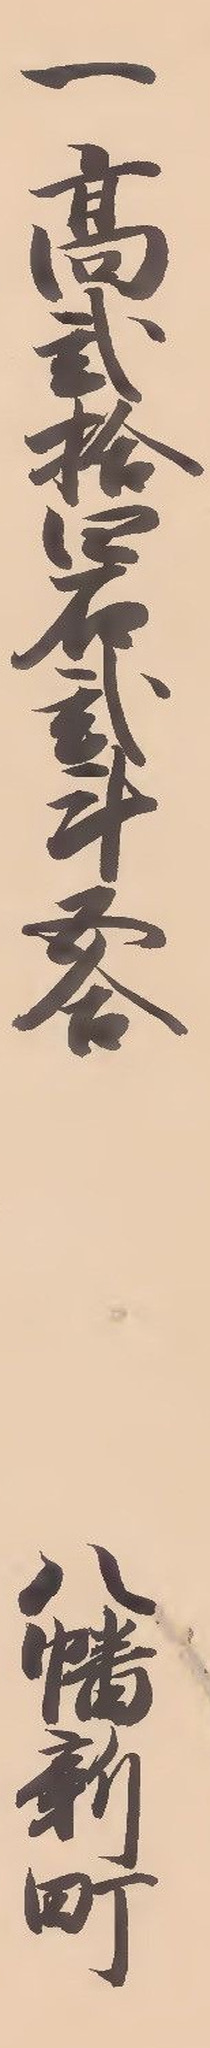一高弐拾四石弐斗五合八幡新町
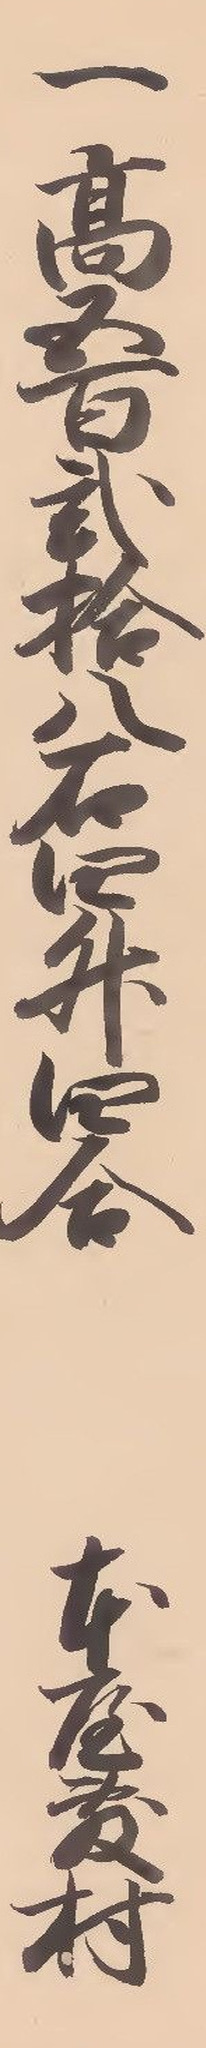一高五百弐拾八石四升四合本屋敷村
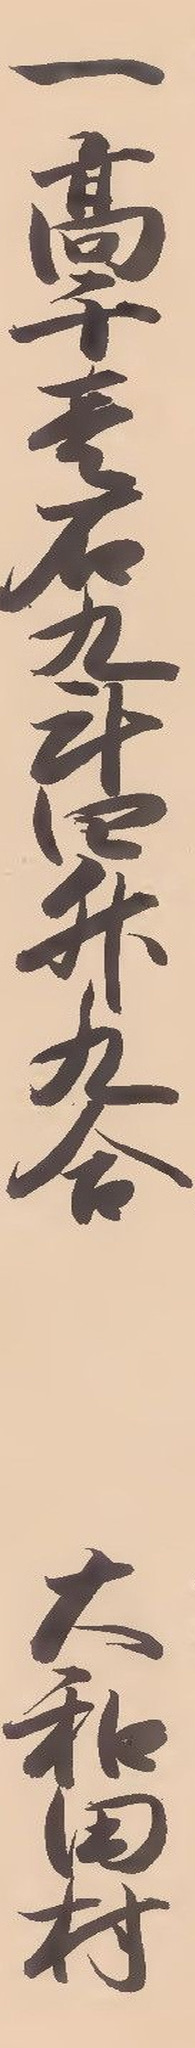一高千壱石九斗四升九合大和田村
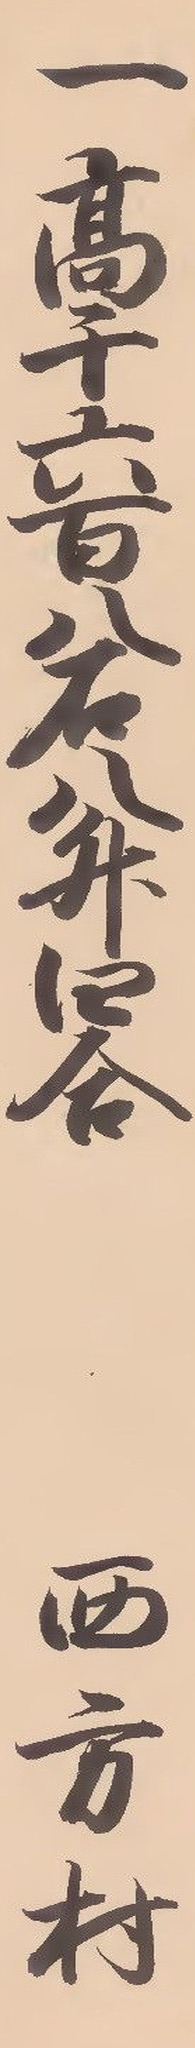一高千六百八石八升四合西方村
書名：佐渡国郷帳
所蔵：国立公文書館 National Archives of Japan
